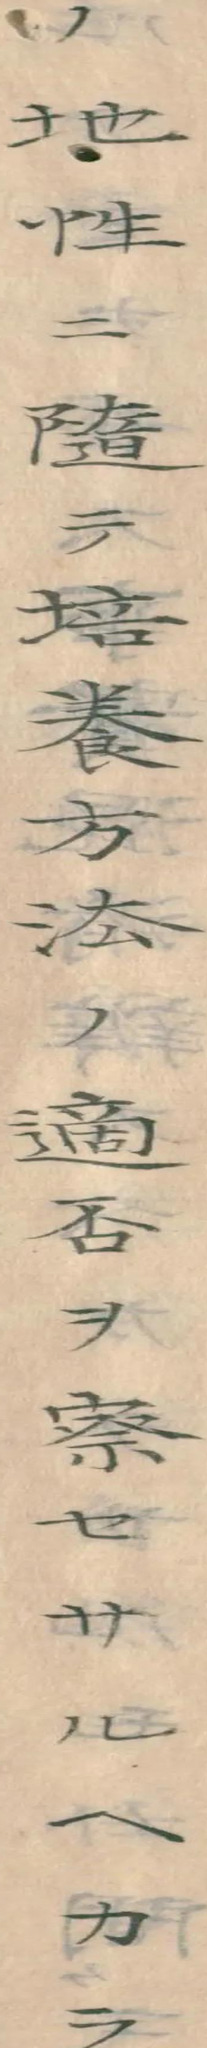ノ地性ニ随テ培養方法ノ適否ヲ察セサルヘカラ
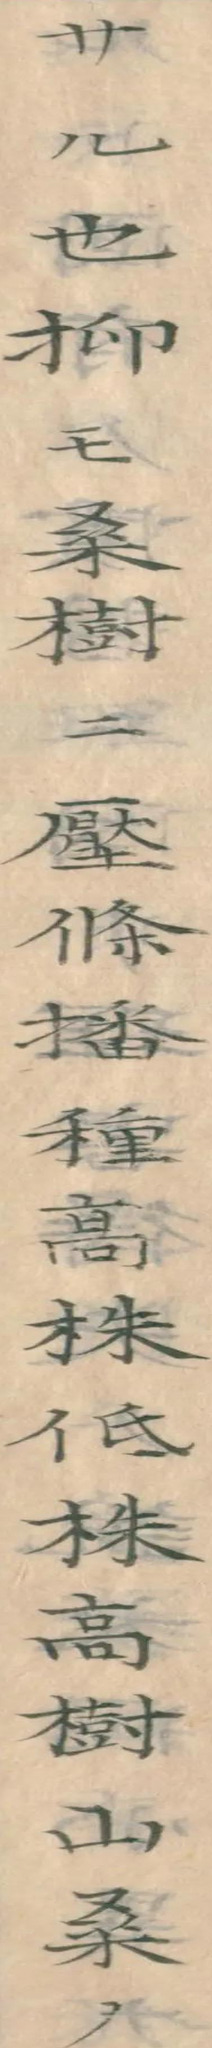サル也抑モ桑樹ニ圧条播種高株低株高樹山桑ノ
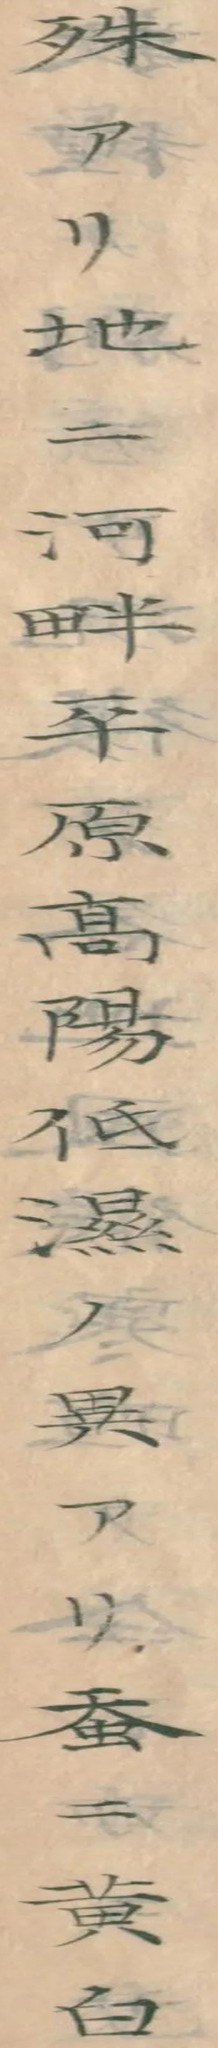殊アリ地ニ河畔平原高陽低湿ノ異アリ蚕ニ黄白

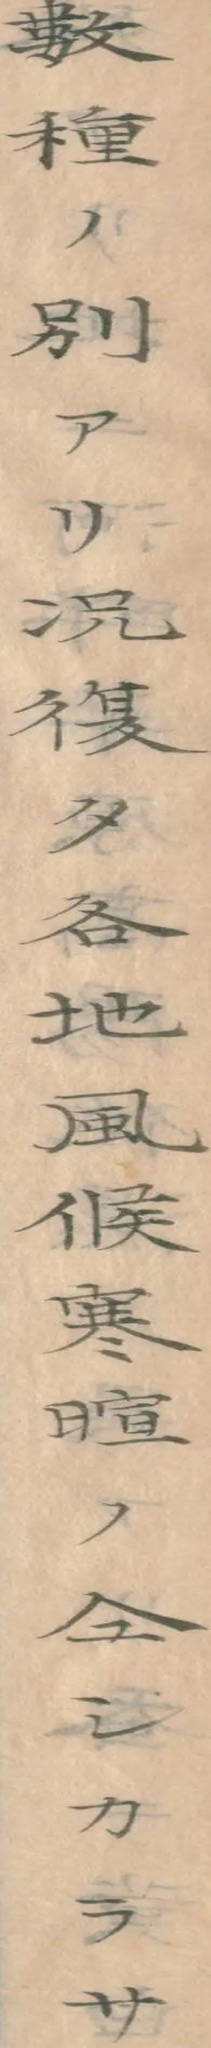数種ノ別アリ况復タ各地風候寒暄ノ仝シカラサ
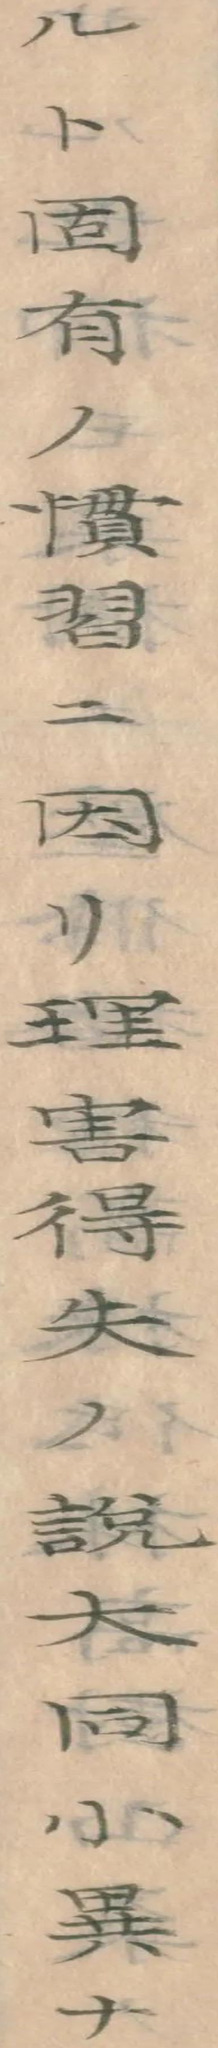ルト固有ノ慣習ニ因リ理害得失ノ説大同小異ナ
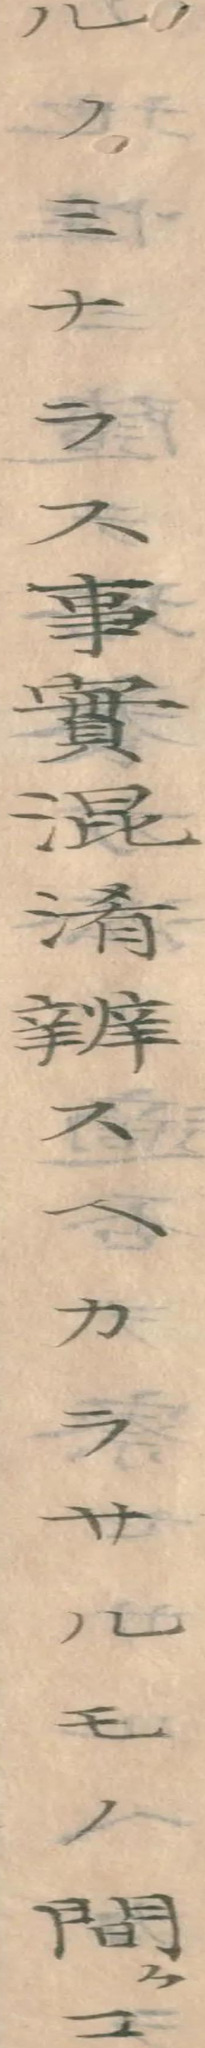ルノミナラス事実混淆弁スヘカラサルモノ間々コ
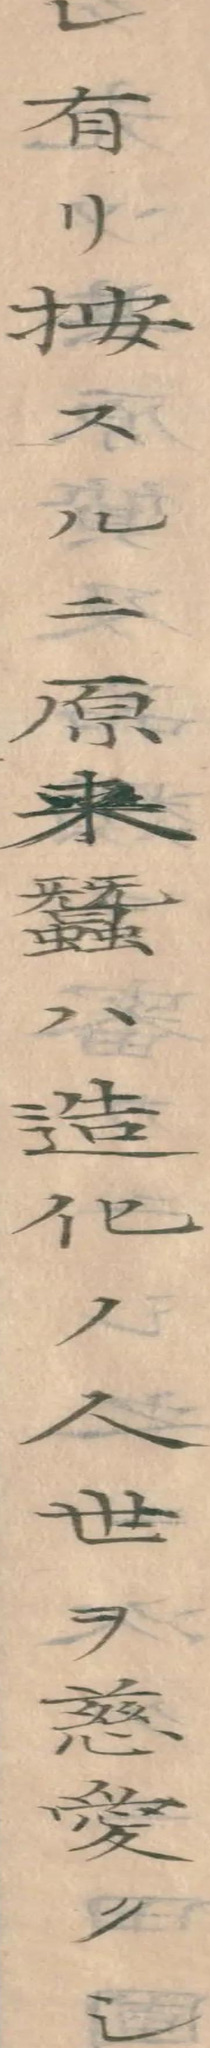レ有リ按スルニ原来蚕ハ造化ノ人世ヲ慈愛クシ
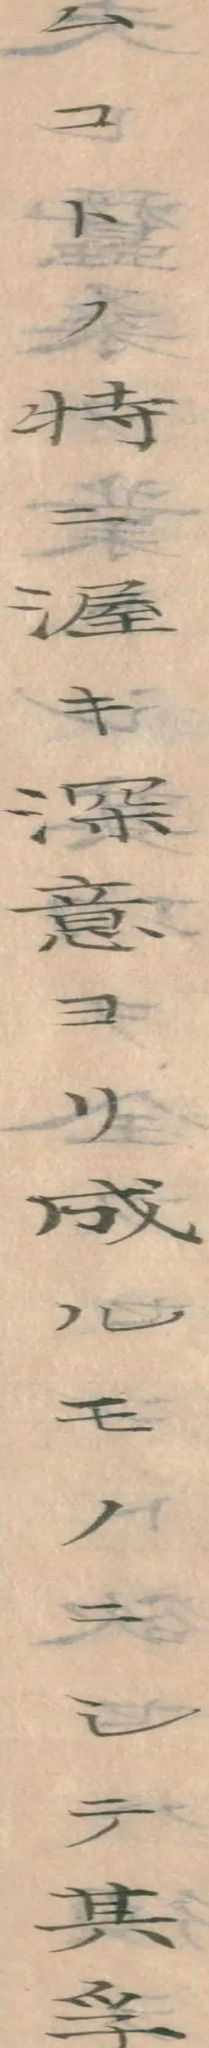ムコトノ特ニ渥キ深意ヨリ成ルモノニシテ其孚
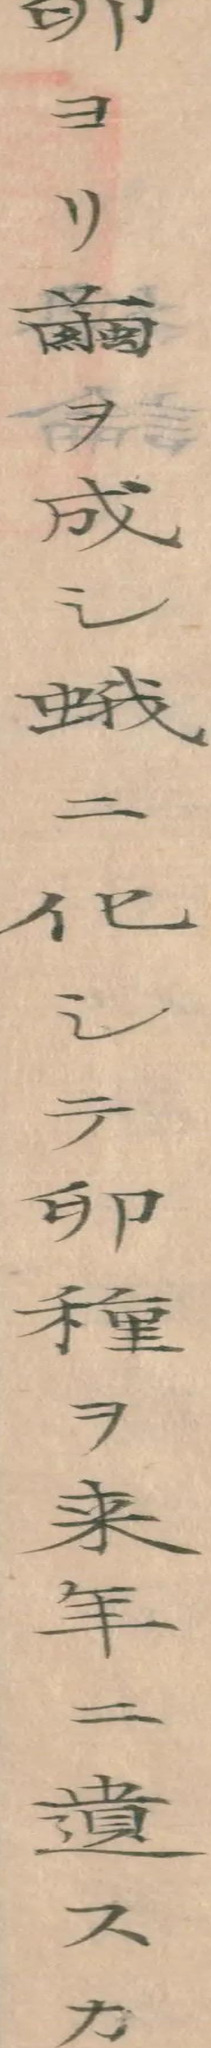卵ヨリ繭ヲ成シ蛾ニ化シテ卵種ヲ来年ニ遺スカ
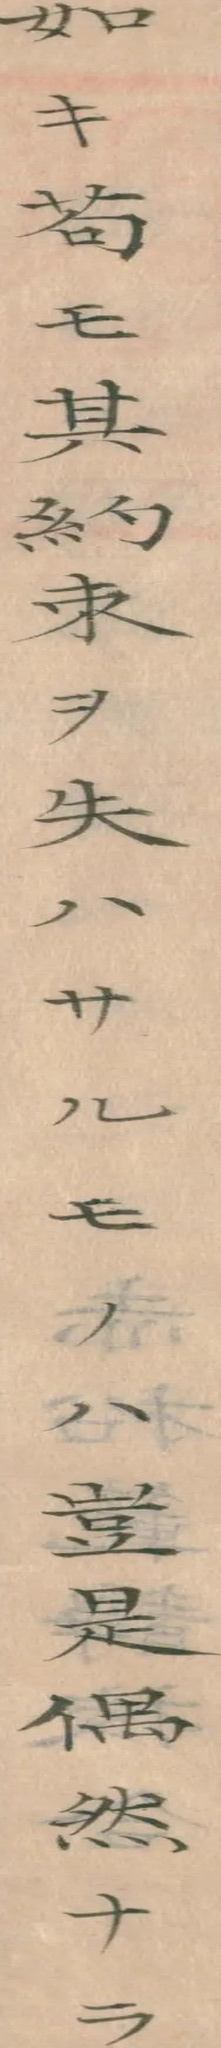如キ苟モ其約束ヲ失ハサルモノハ豈是偶然ナラ
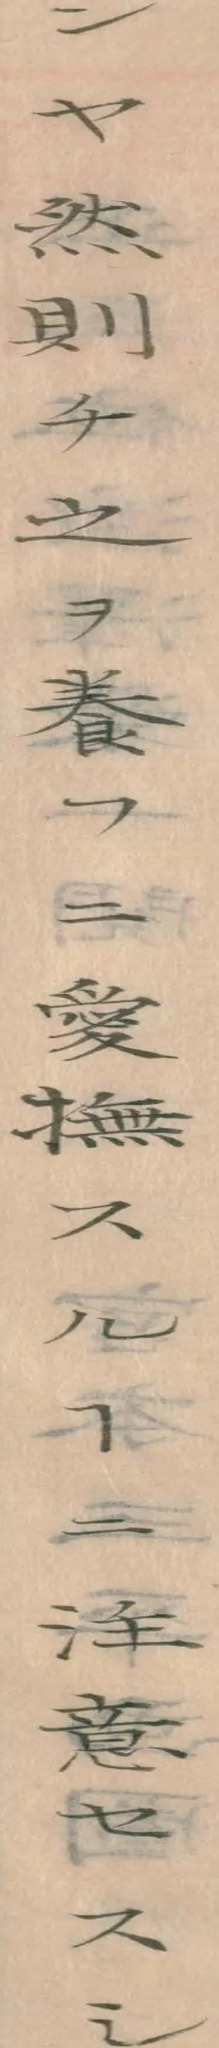ンヤ然則チ之ヲ養フニ愛撫スルコトニ注意セスシ
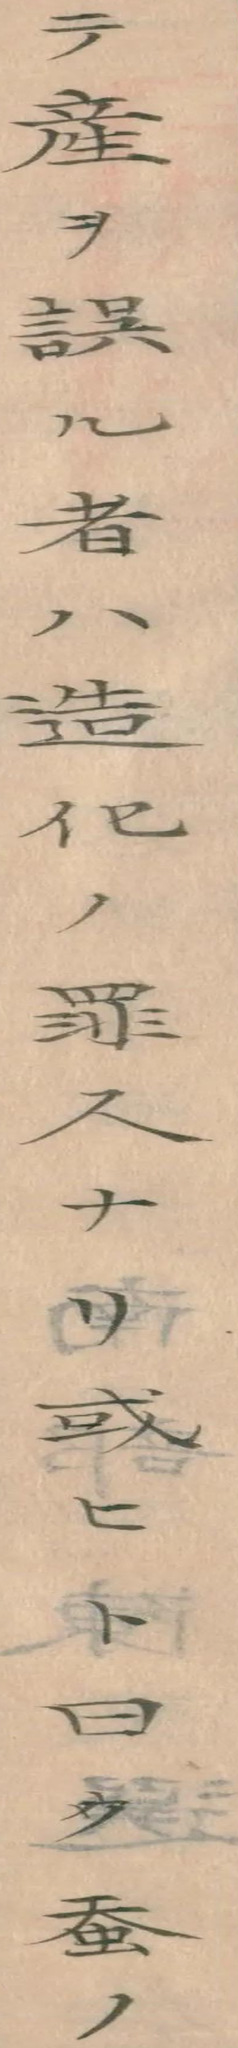テ産ヲ誤ル者ハ造化ノ罪人ナリ或ヒト曰ク蚕ノ
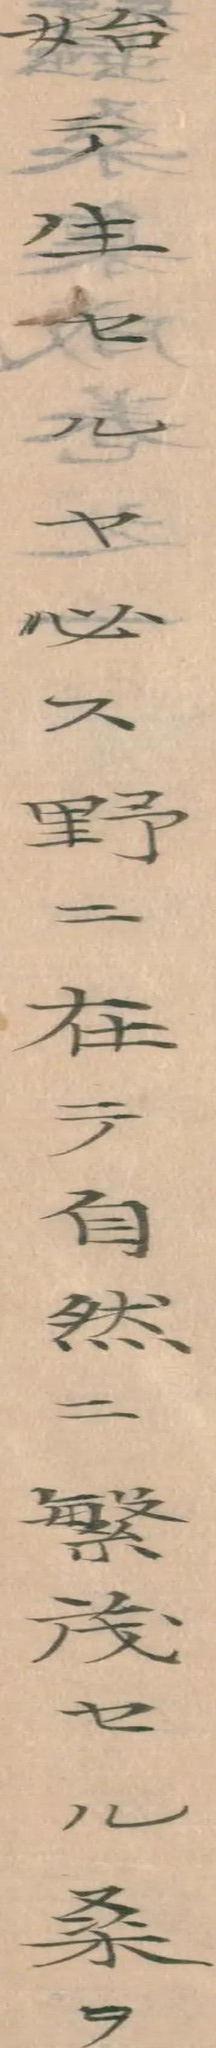始テ生セルヤ必ス野ニ在テ自然ニ繁茂セル桑ヲ
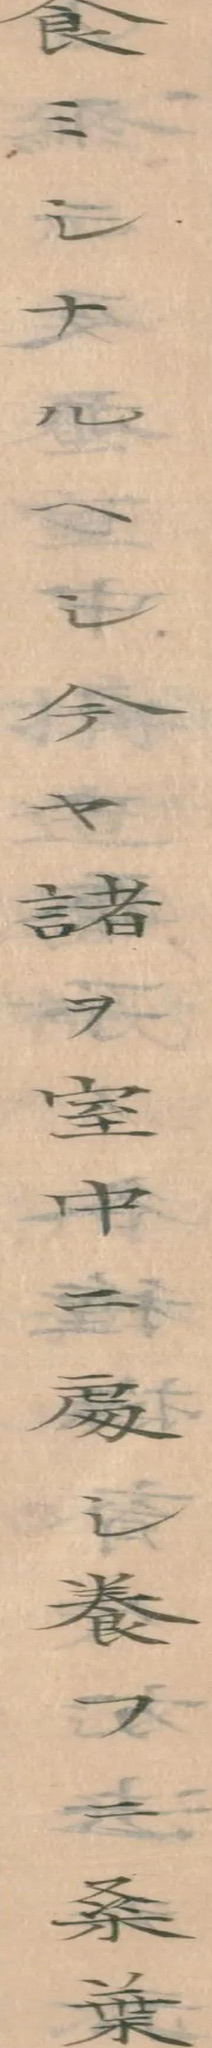食ミシナルヘシ今ヤ諸ヲ室中ニ処シ養フニ桑葉
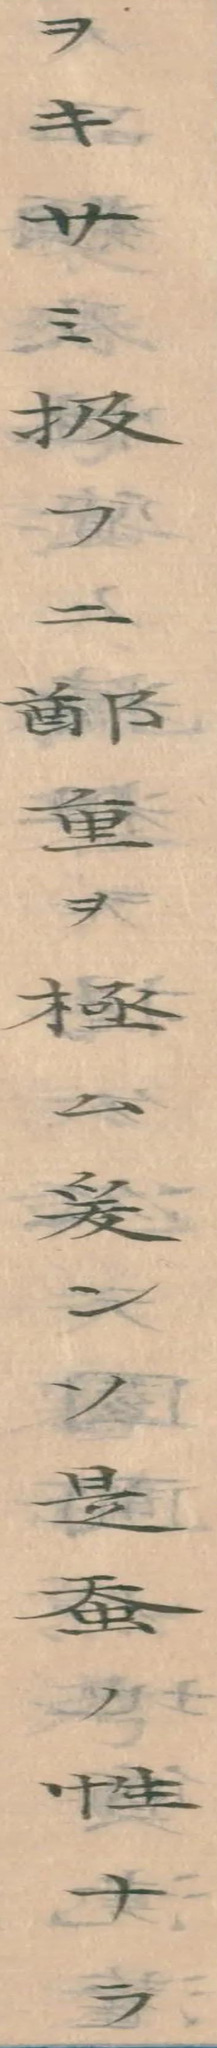ヲキサミ扱フニ鄭重ヲ極ム爰ンソ是蚕ノ性ナラ
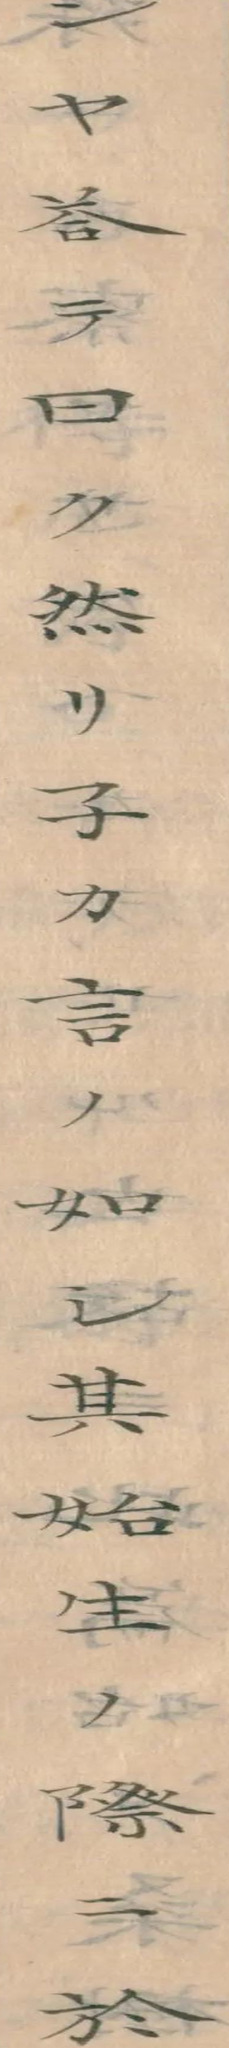ンヤ荅テ曰ク然リ子カ言ノ如シ其始生ノ際ニ於
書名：蚕桑集成
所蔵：国立国会図書館 National Diet Library, JAPAN
